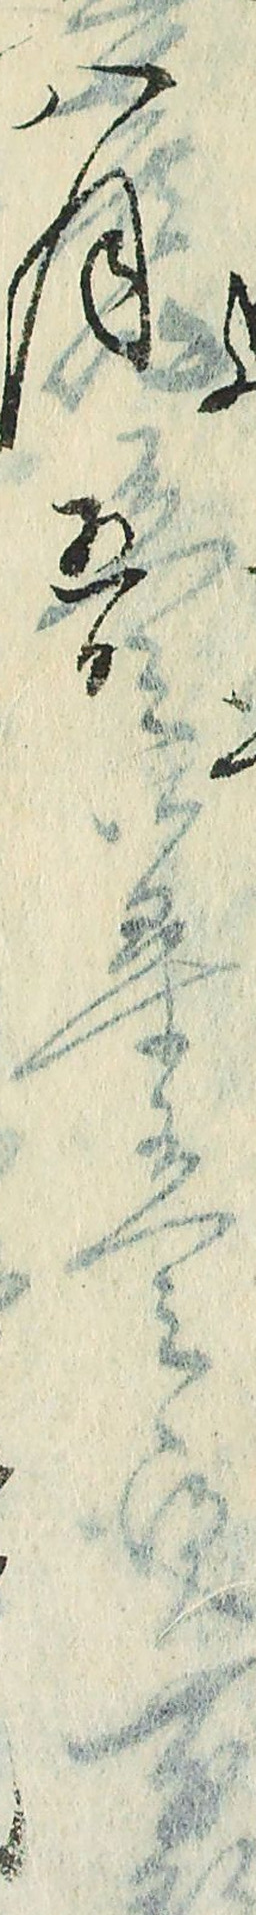八月五日
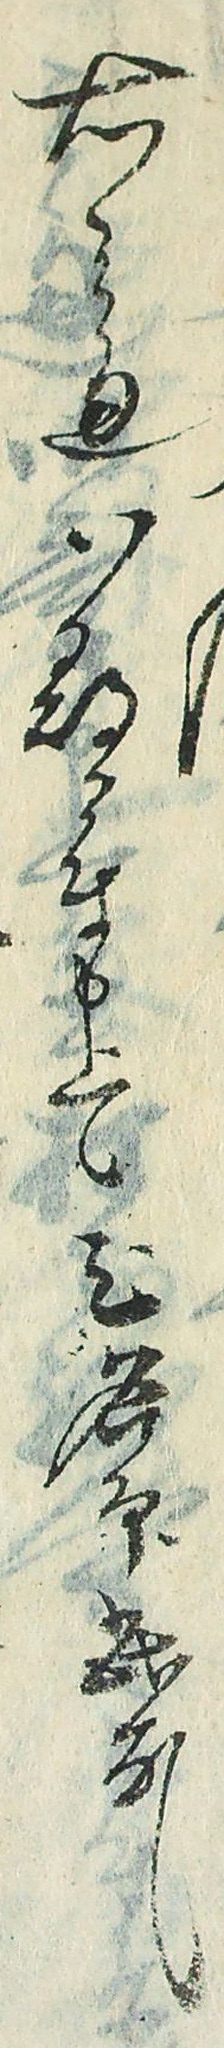右之通御尋に付申上候尤名印当なし
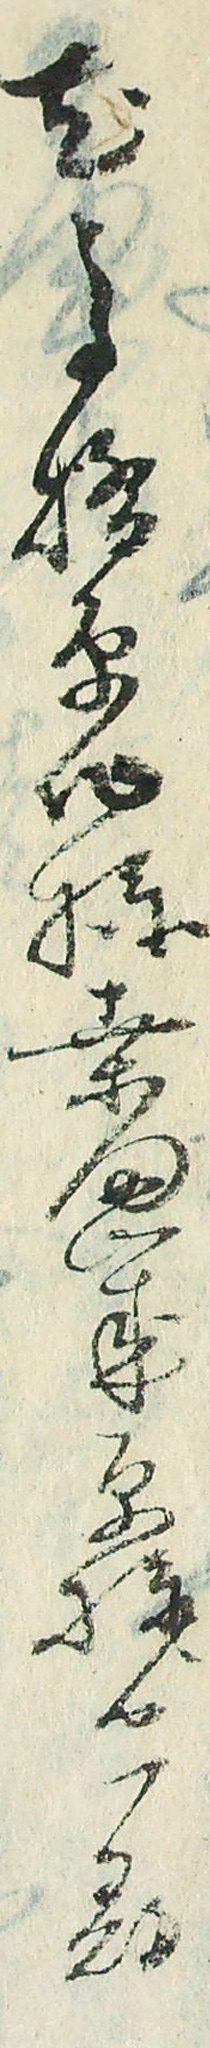尤高橋平作様桑田歳兵衛様ゟ御尋

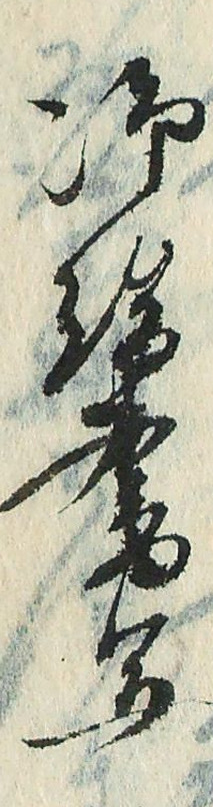御端書写
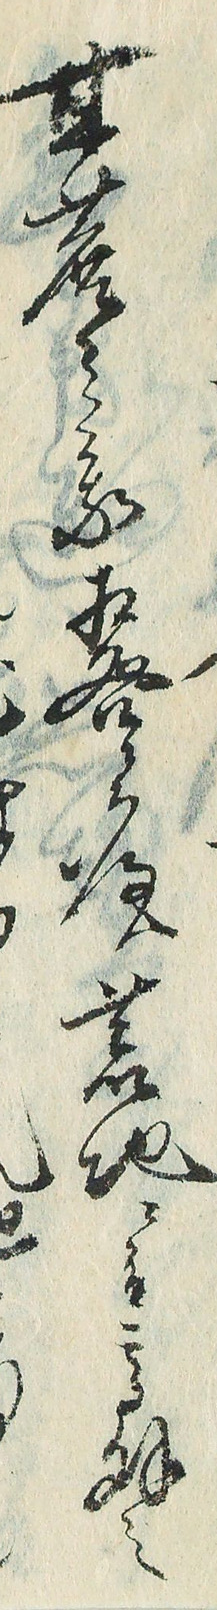甘藷之義相咎に候得は荒地に付其外之
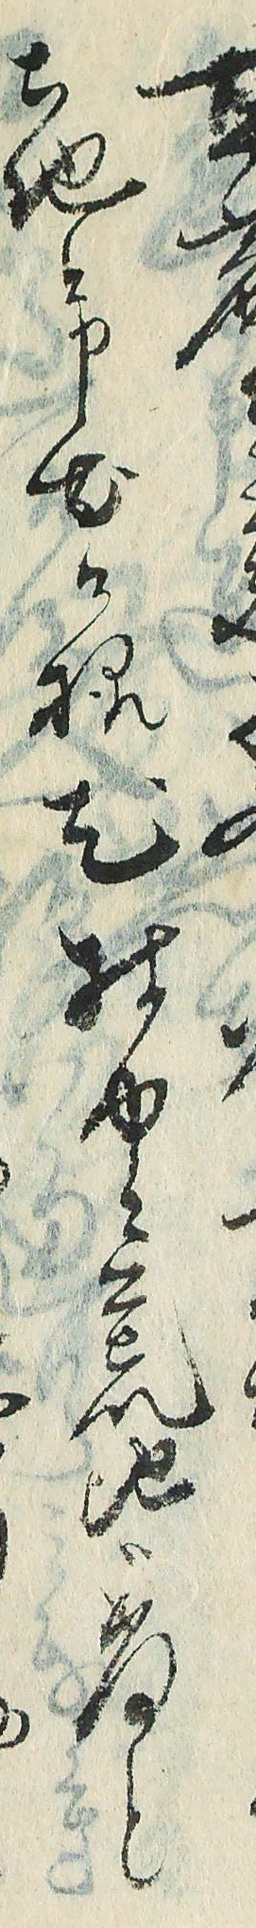土地に申出候様尤村中に荒地は如何と
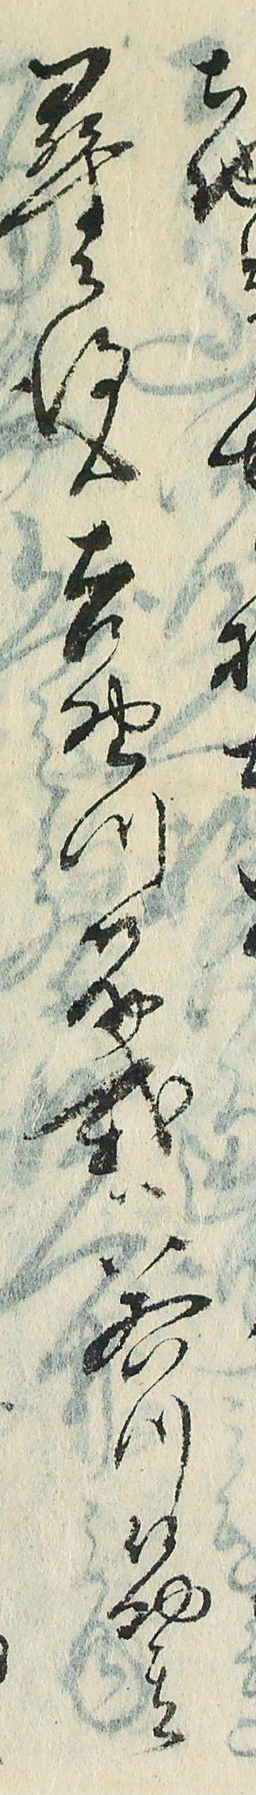尋候得は吉野川筋或は谷川筋其
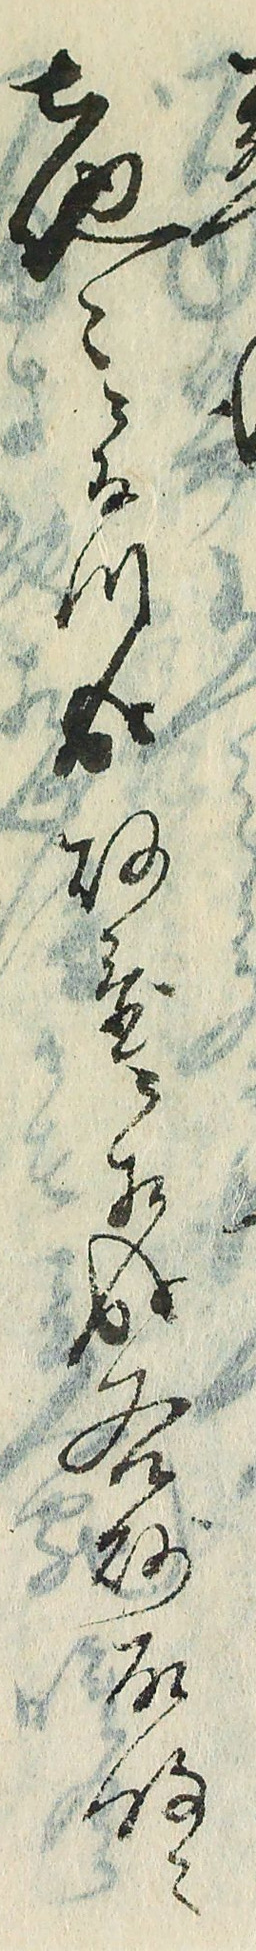土地々にて川成砂置に相成右砂取明候
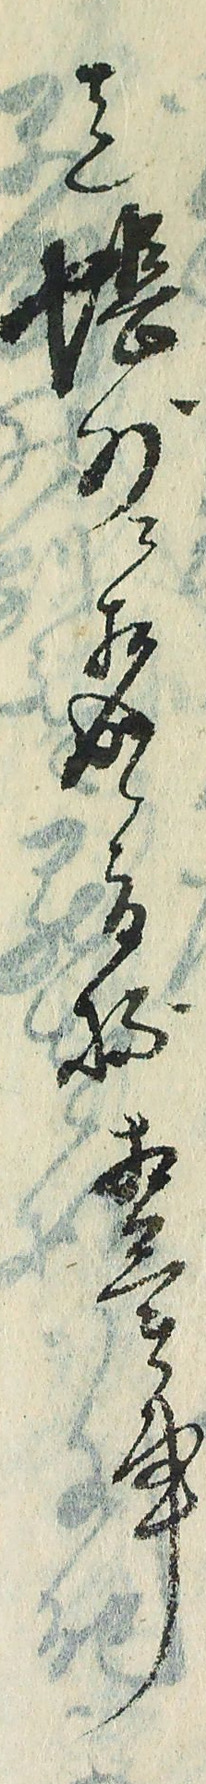迄帳外に相成候旨抔相答候事
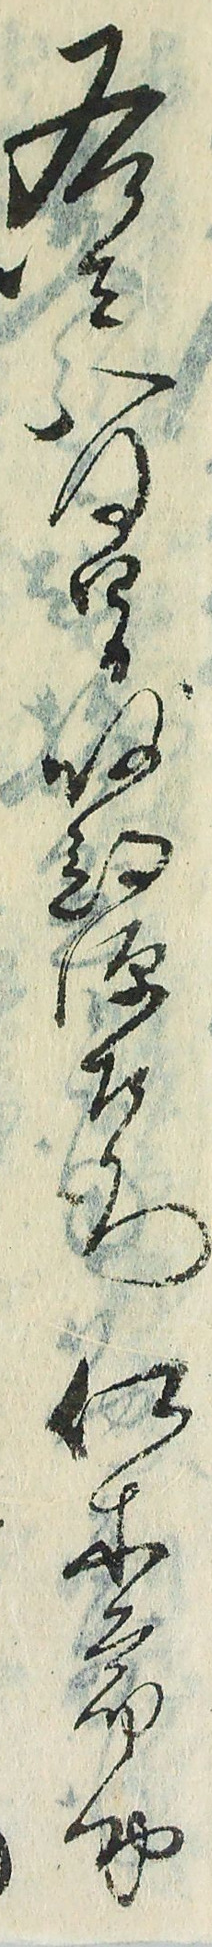右は八月四日阿部源左衛門仁木節助
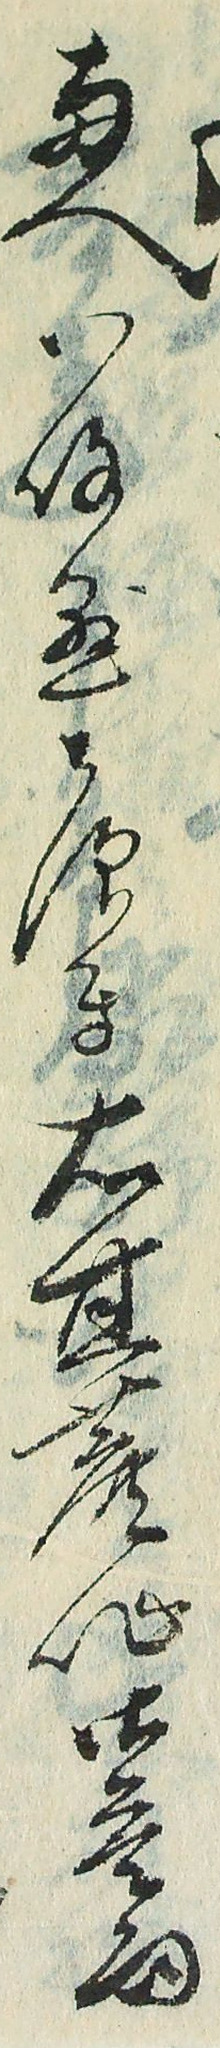両人御役懸被仰付右甘藷作御答向
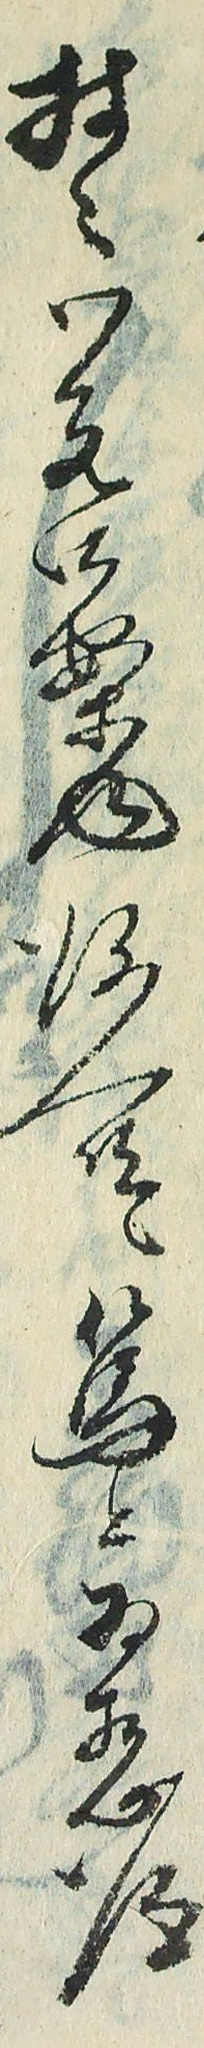村々御先御案内役人共へ篤と為相心得
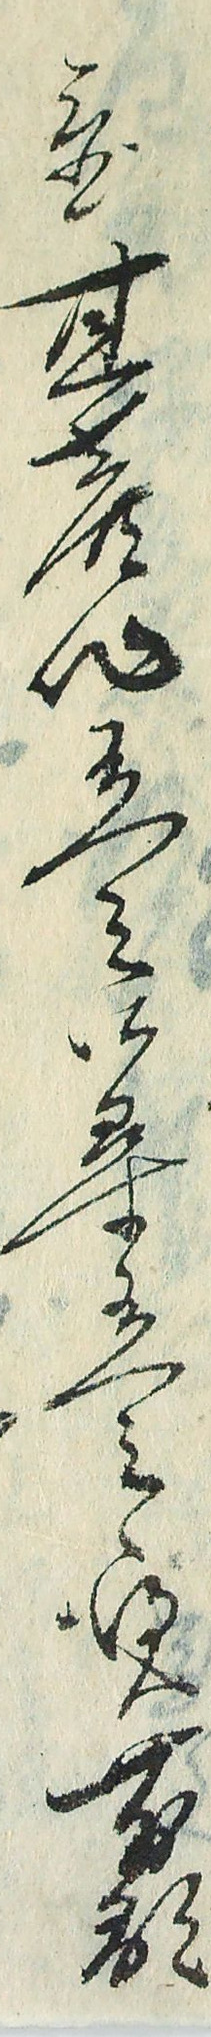置甘藷作有之御尋有之候得は前顕
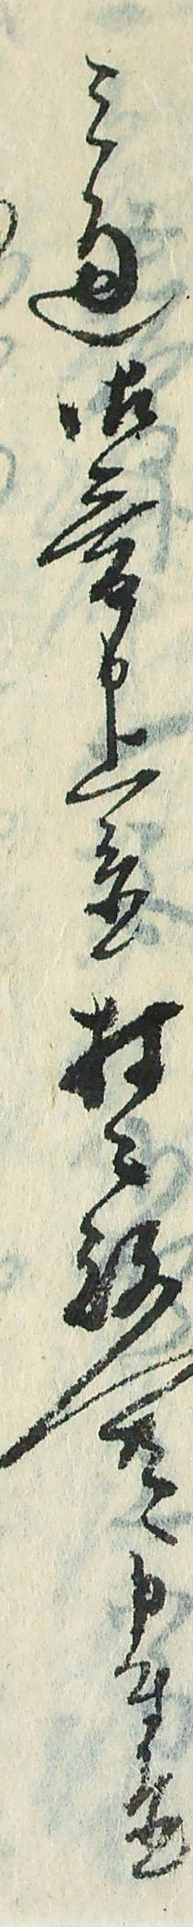之通御答申上置村々役人共へ申付置
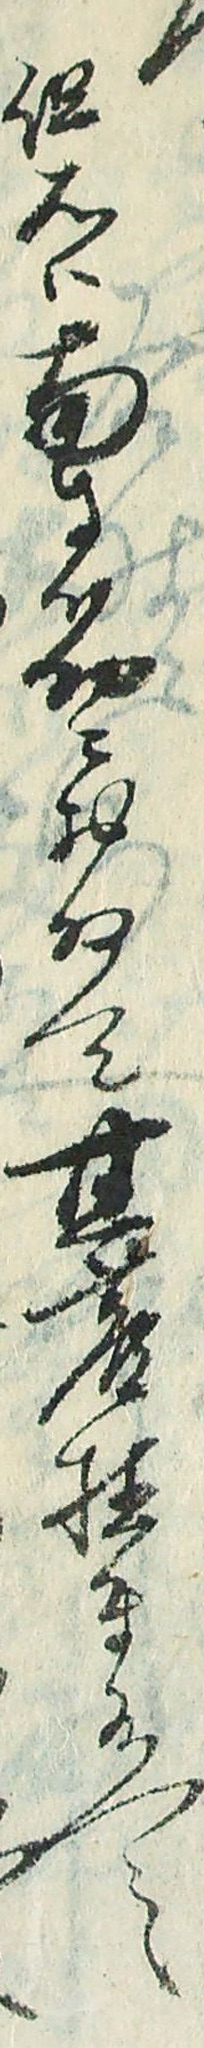但右は南方筋におゐて甘藷植付有之
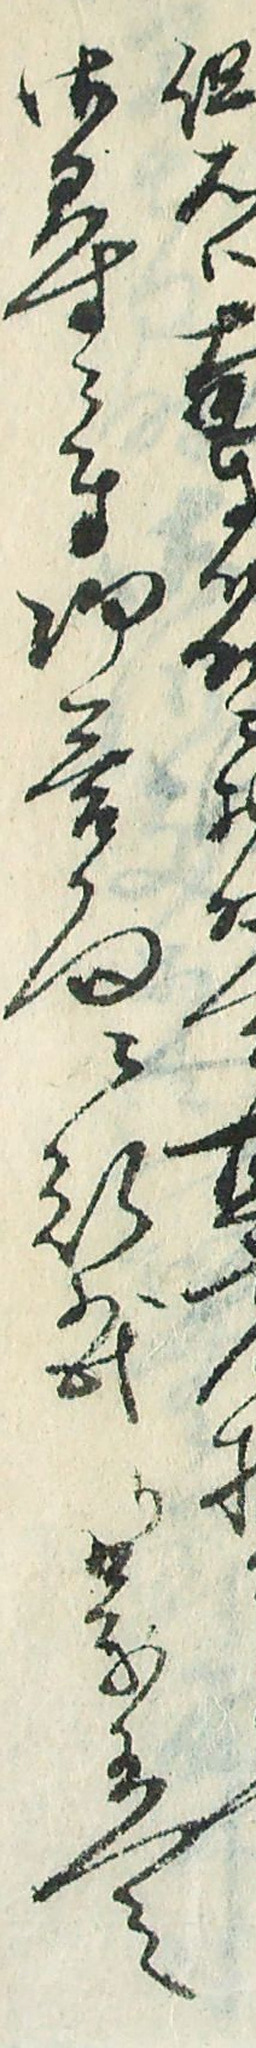御尋に付御答向に斯当り候義有之
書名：公辺御役人為御廻浦御立越諸御用一巻
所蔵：鳴門教育大学 Naruto University of Education
